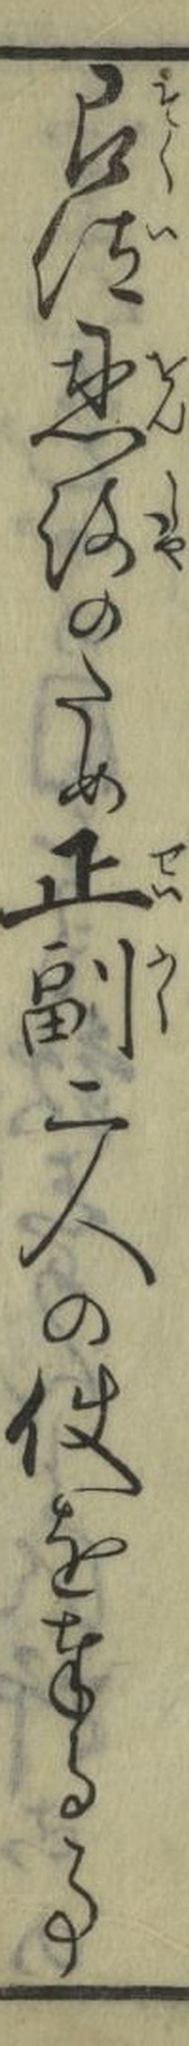即位恩謝のため正副二人の仗を奉る事
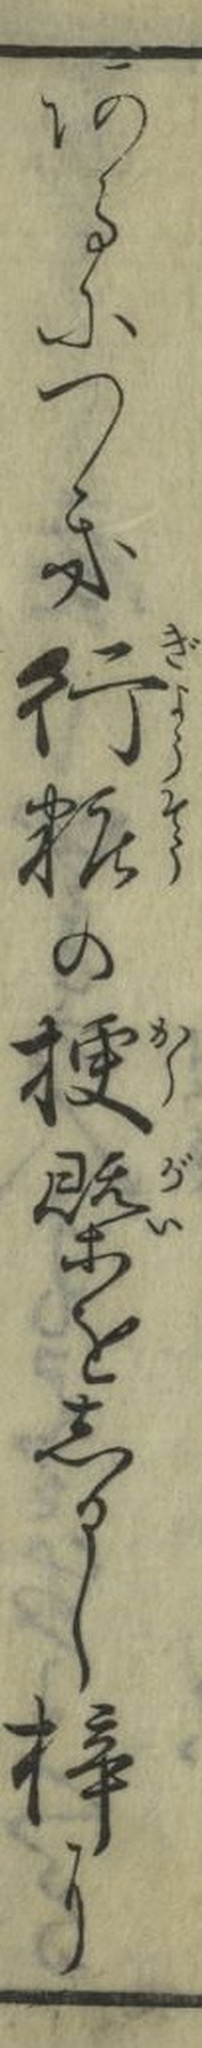あるにつき行粧の梗概をしるし梓に

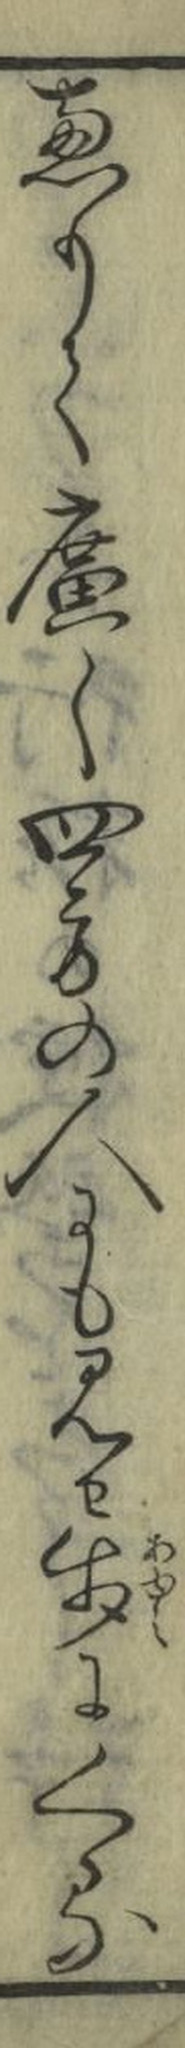ゑりて広く四方の人にも見せ歩にくる
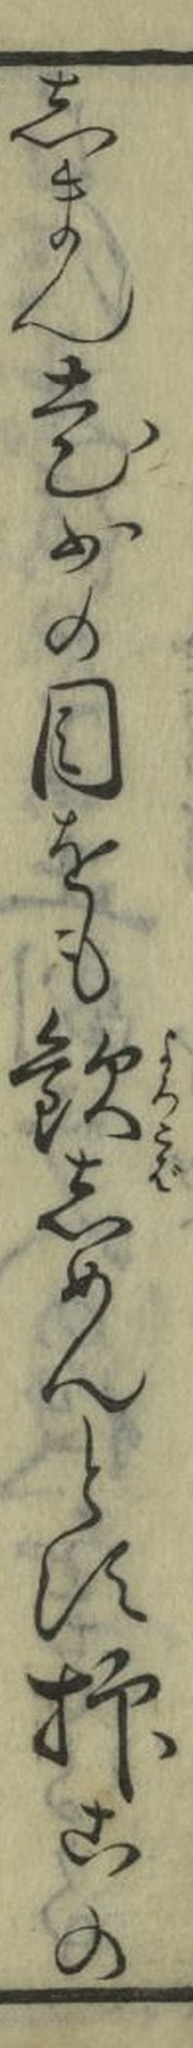しまん老少の目をも歓しめんとす抑この
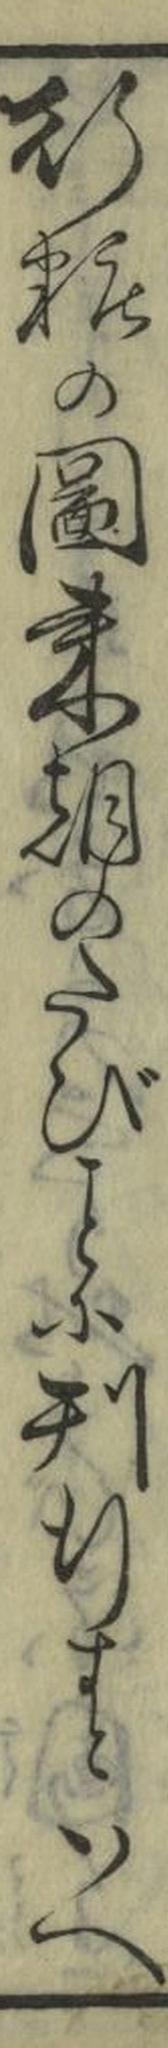行粧の図来朝のたびことに刊行すといへ
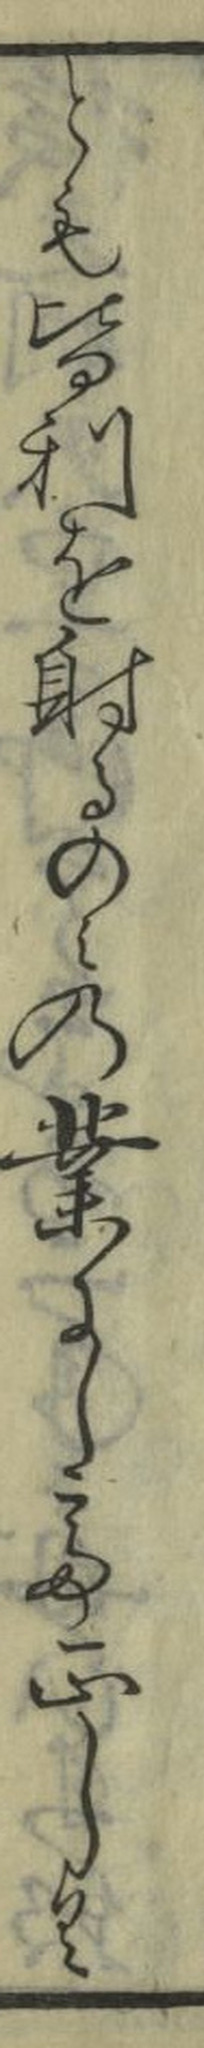とも皆利を射るのみの業にして正しく
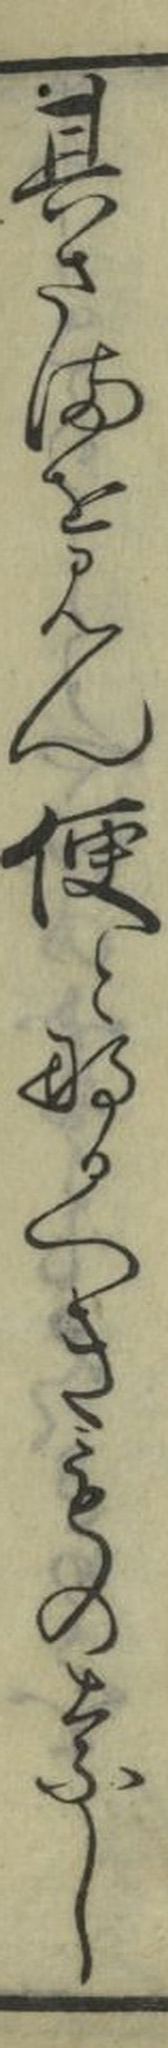其さまを見ん便となるへきものなく
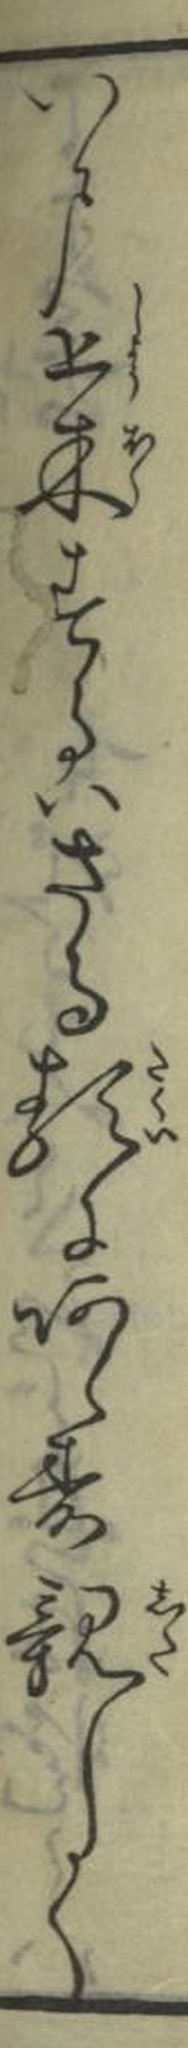いま上木するはさる類にあらす親しく
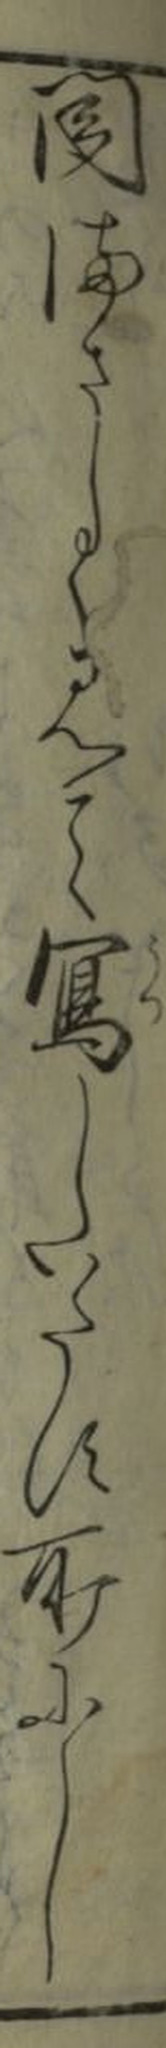聞まさしく見て写しいたす所にし
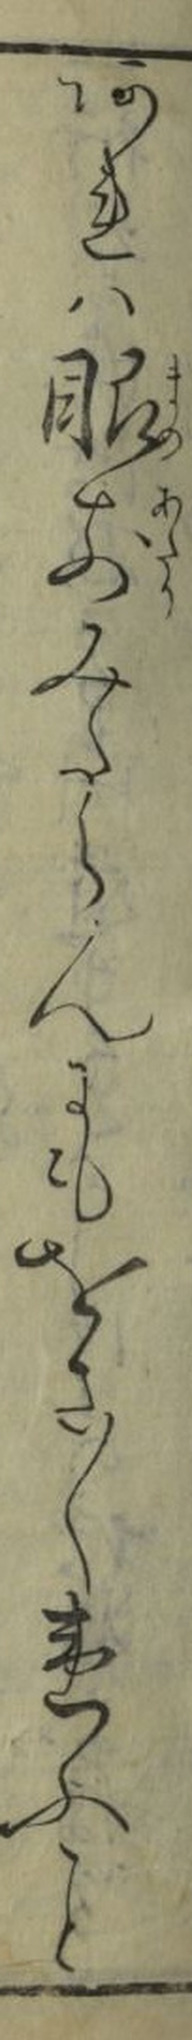あれは眼前みたらんにもをさ〳〵違ふこと
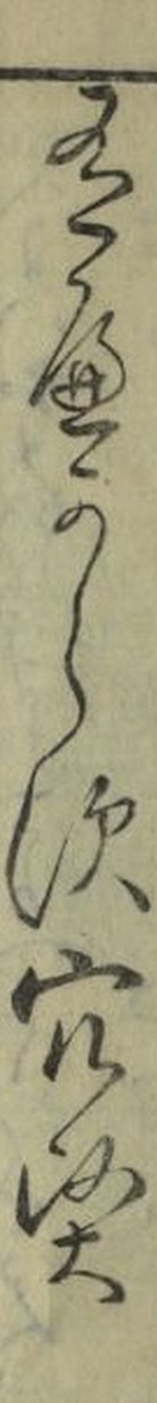有へからす穴賢
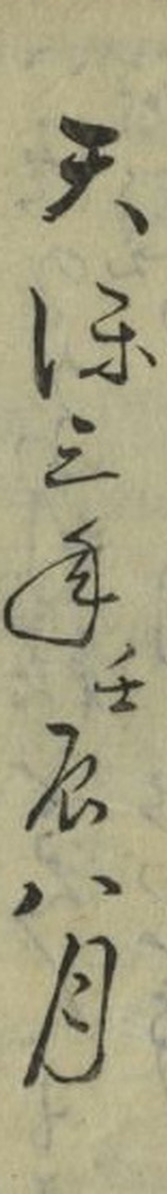天保三年壬辰八月
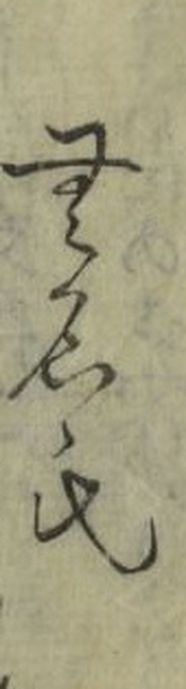無名氏
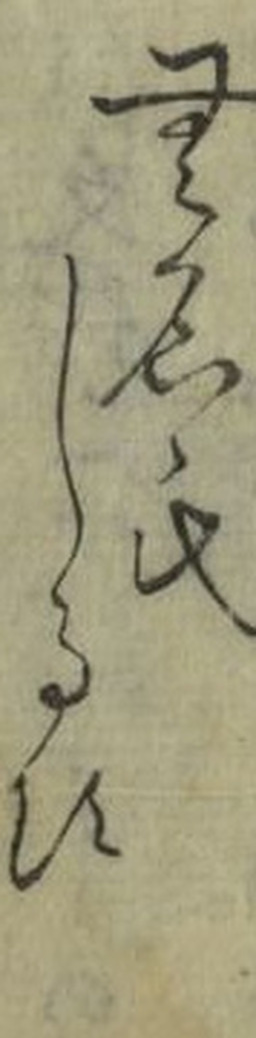しるす

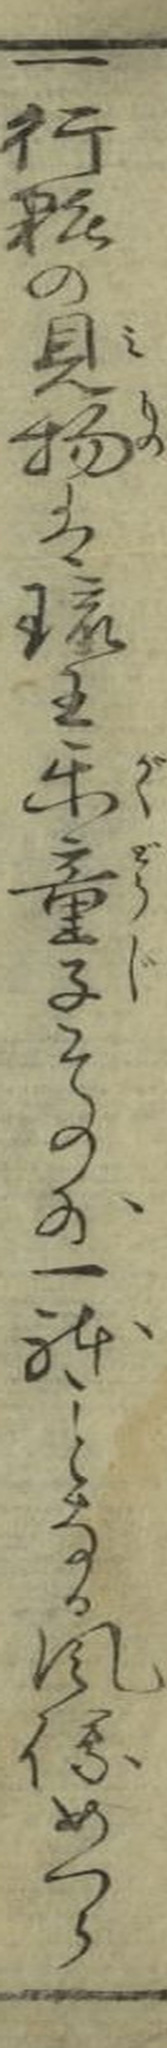一行粧の見物は琉王楽童子その外一躰ことなる風儀めつら
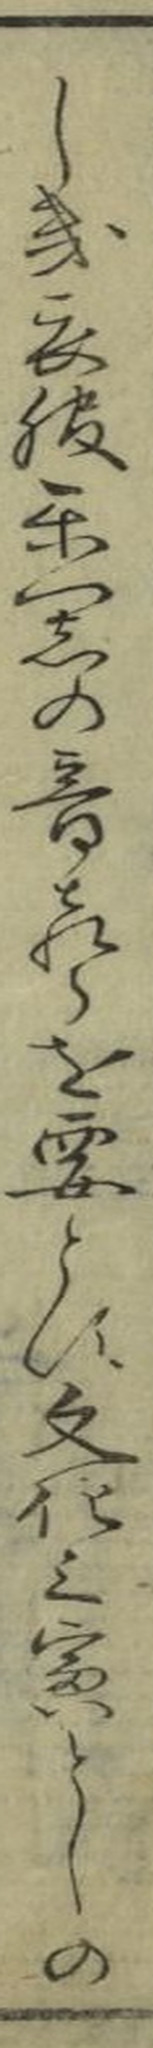しき衣服楽器の音声を要とす文化三寅としの
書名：新板 琉球人行列記
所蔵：University of the Ryukyus Library
